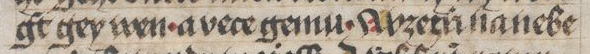ḡt gey wen.a vece gemu.Wzezṙi na nebe
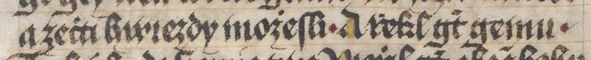a zeċti hwiezdy możeẛli.A ṙekl ḡt gemu.
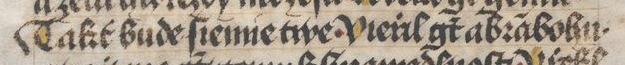Takṫ bude ſiemie twe.Vieṙil ḡt abrā bohu.
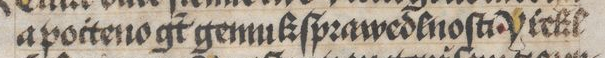a poċteno ḡt gemu k ſprawedlnoſti.Y ṙekl
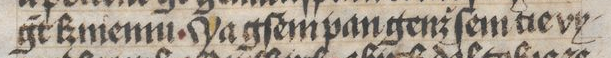ḡt kniemi.Ya gſem pan genž ſem tie yy¬
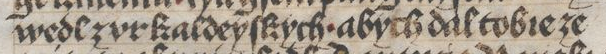wedl z vr kaldeyſkych.abych dal tobie ze¬
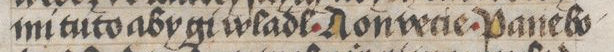mi tuto aby gi wladl. A on vecie.Pane bo¬
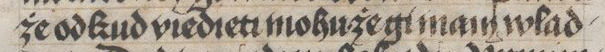że od kud viedieti mohu.że gi mam wlad¬
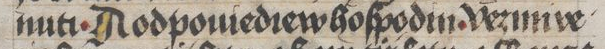nuti.A odpouiediew hoſpodin.Vezmi ve¬
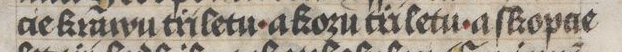cie krawu tṙíletu.a kozu tṙí letu.a ſkopcie
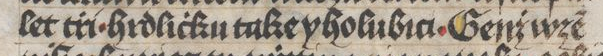let tṙí.hrdliċku take y holubici.Genż wzē
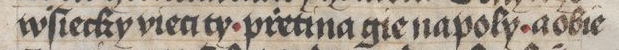wẛiecky vieci ty.pṙetina gie napoly.a obie¬
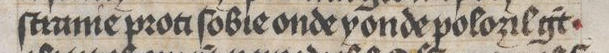ſtranie proti ſobie onde y onde polożil ḡt.
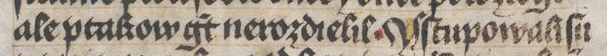ale ptakow ḡt nerozdielil.Yſtupowali ſu.
